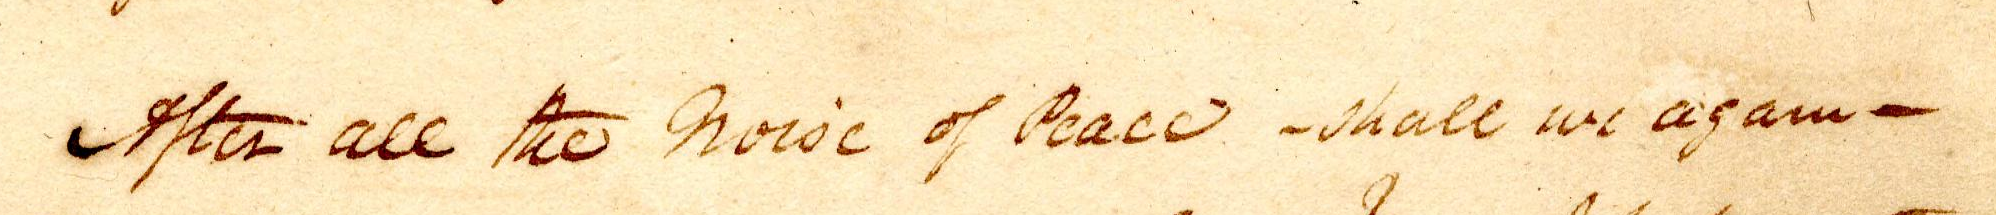After all the noise of Peace- shall we again
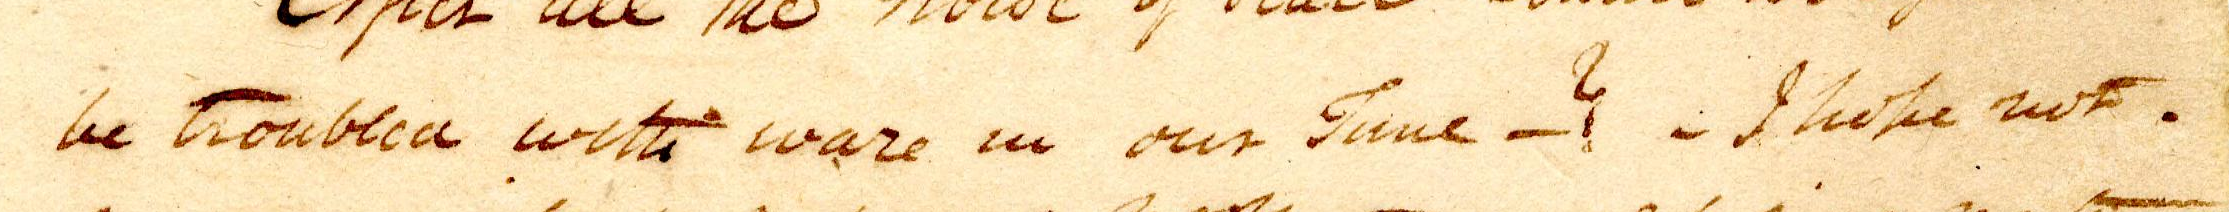be troubled with war in our Time? I hope not
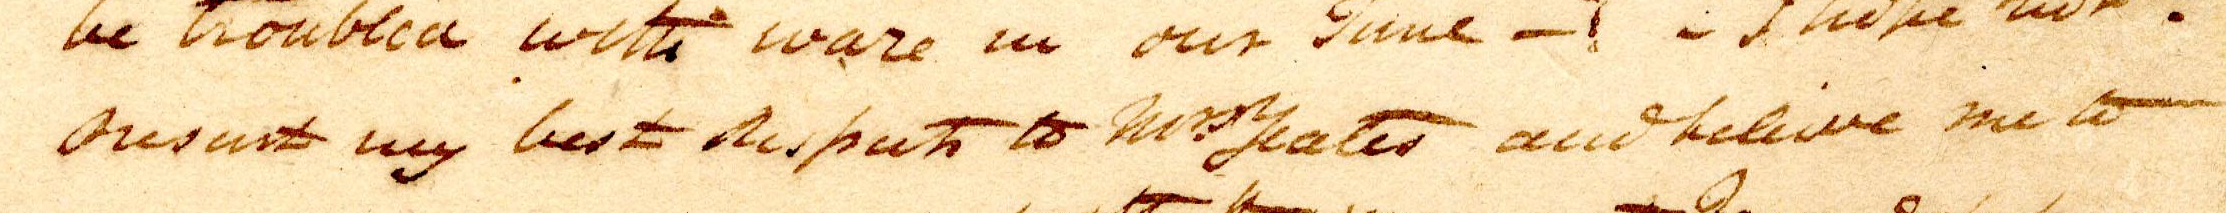present my best Respects to M^rs. Yeates and believe me to
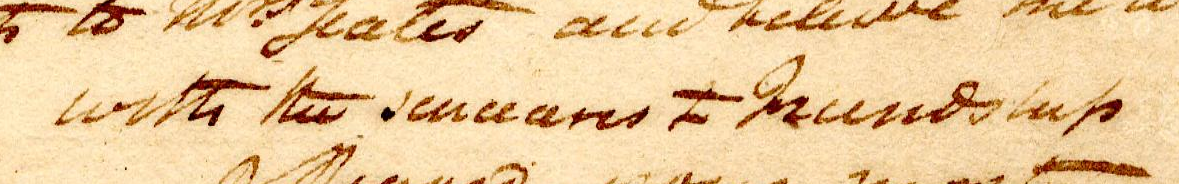with the sincearest friendship
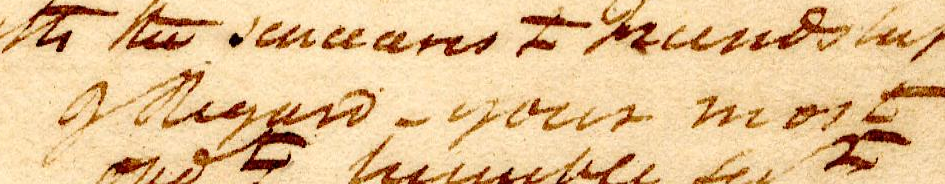& Regard, your most
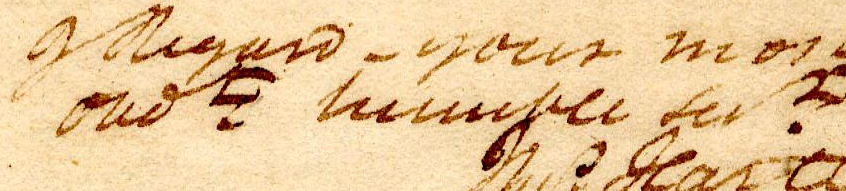obed^t humble serv^t.
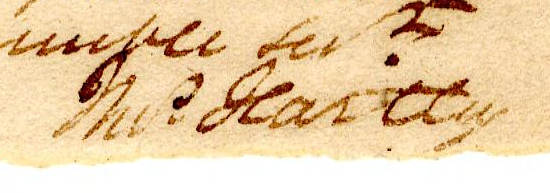Tho^s Hartley
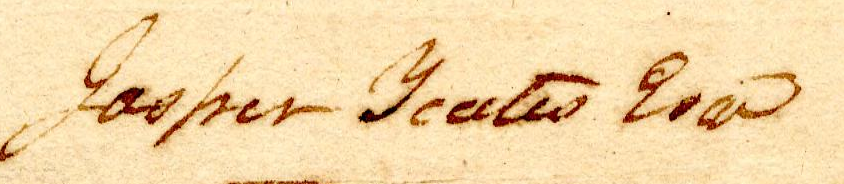Jasper Yeates Esq^r
